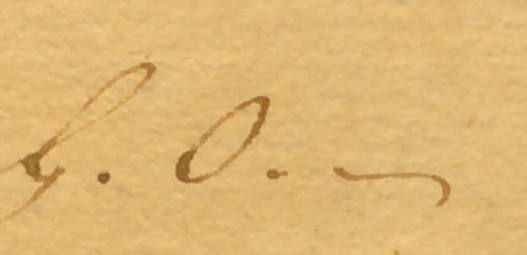G.O.-
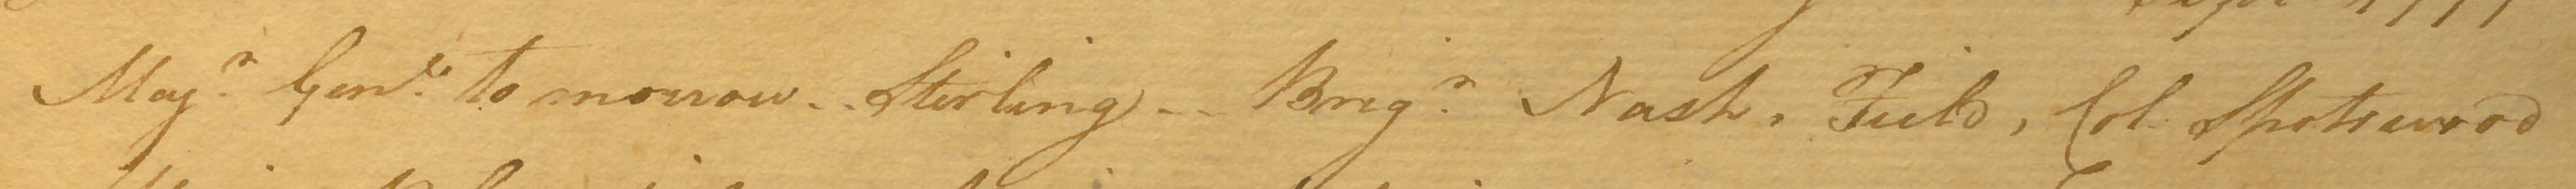Maj^r. Gen^l. tomorrow.. Stirling.. Brig^r. Nash. Field. Col Spotswood
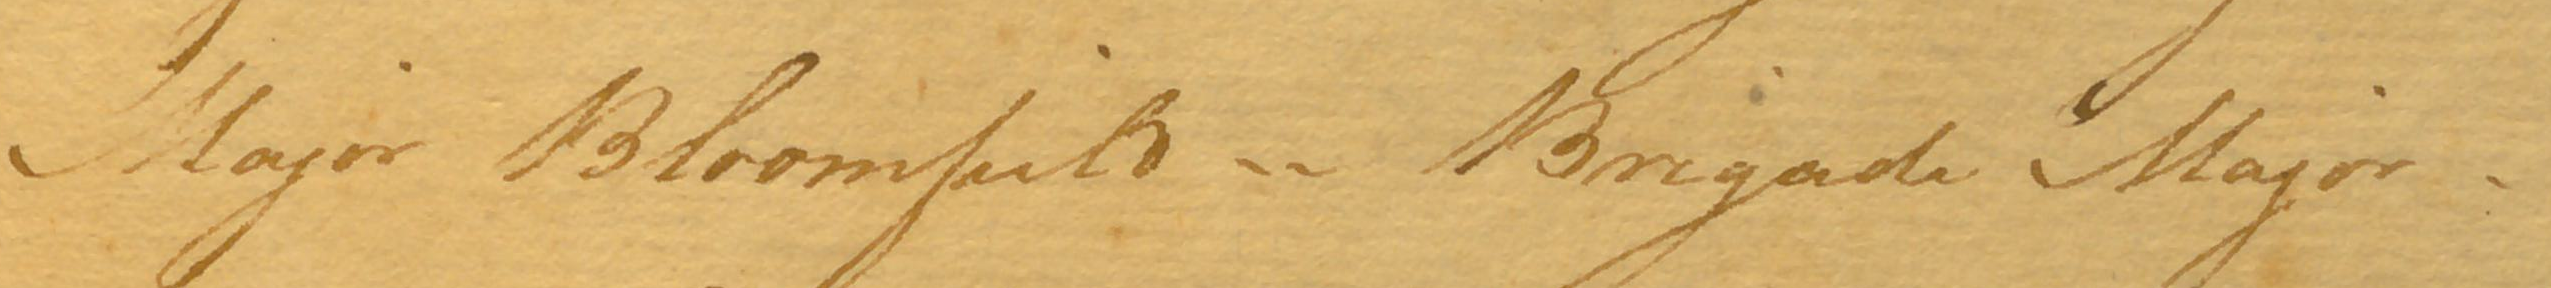Major Bloomfield.. Brigade Major.
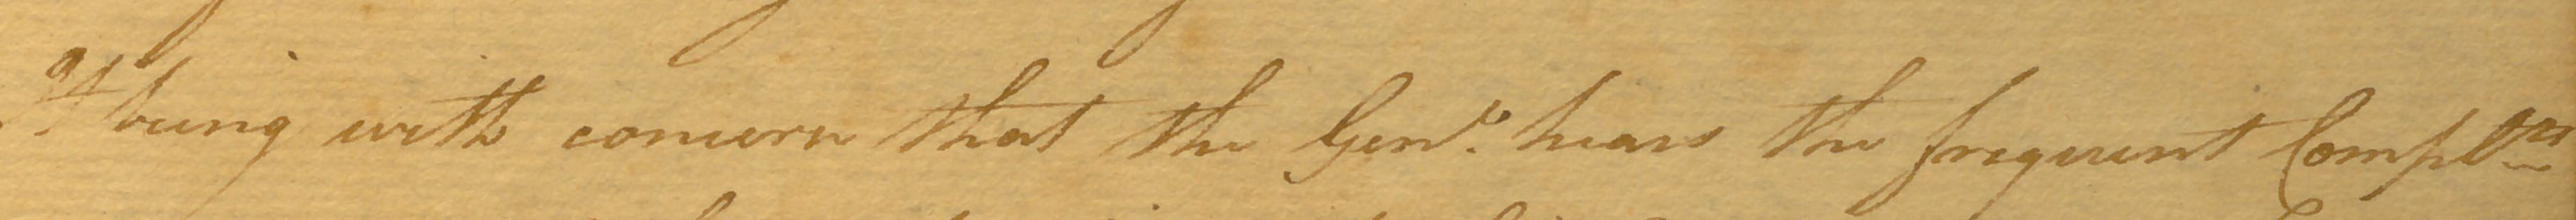It being with concern that the Gen^l. bears the frequent Compl^ts
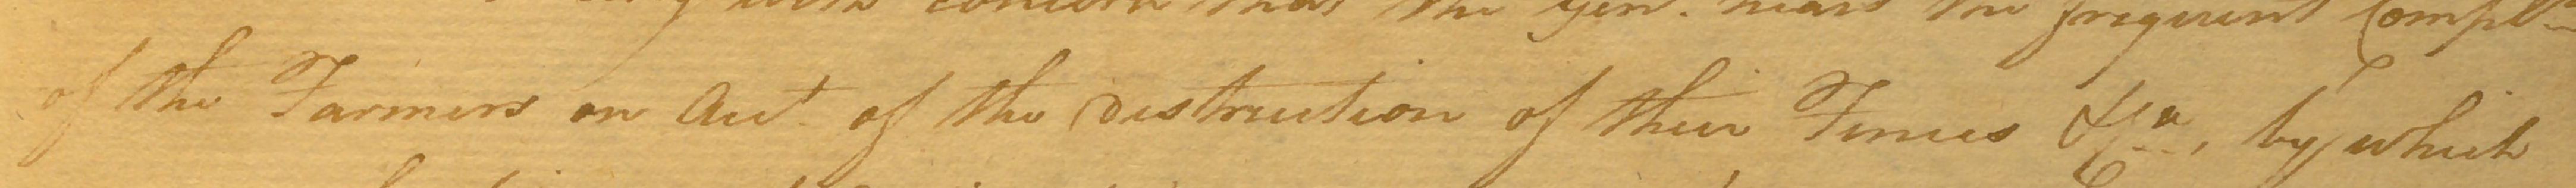of the Farmers on Acc^t of the destruction of their Fences &ca., by which
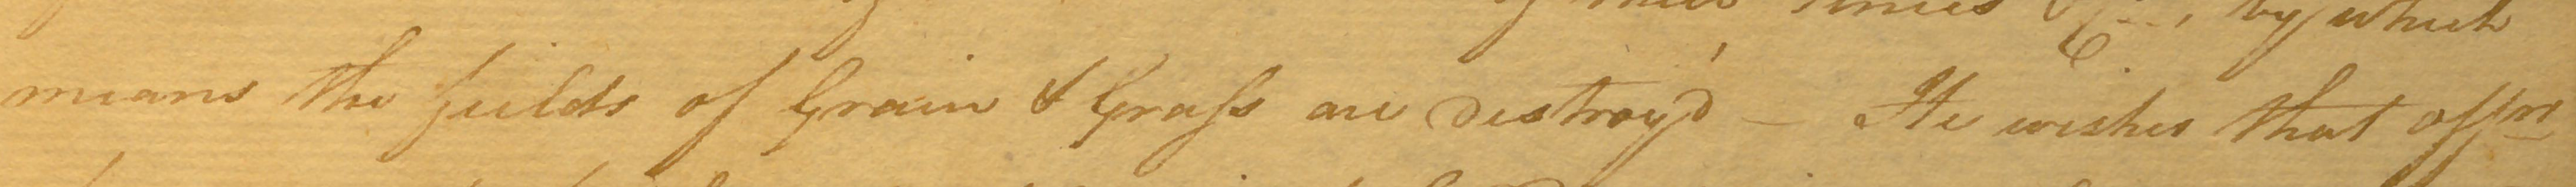means the fields of Grain & Grass are destroy'd- He wishes that off^rs
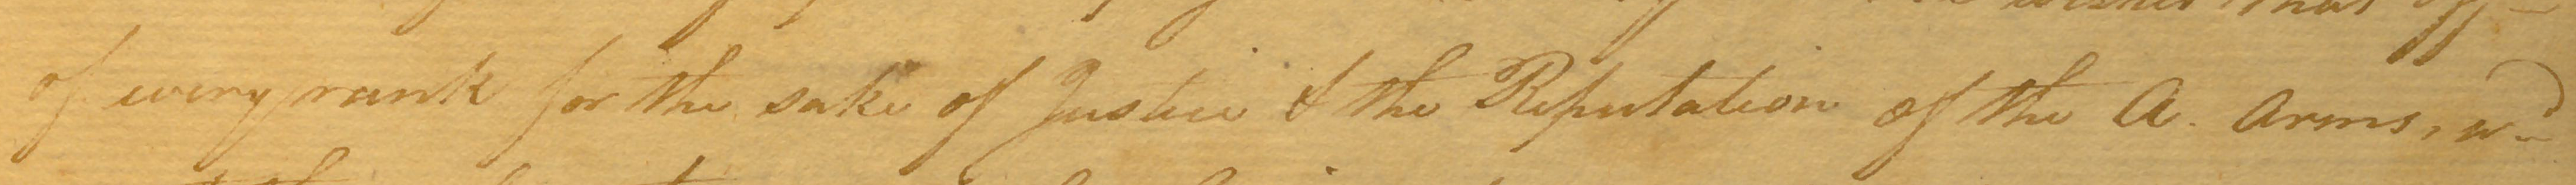of every rank for the sake of Justice & the Reputation of the A. Arms, w^d.
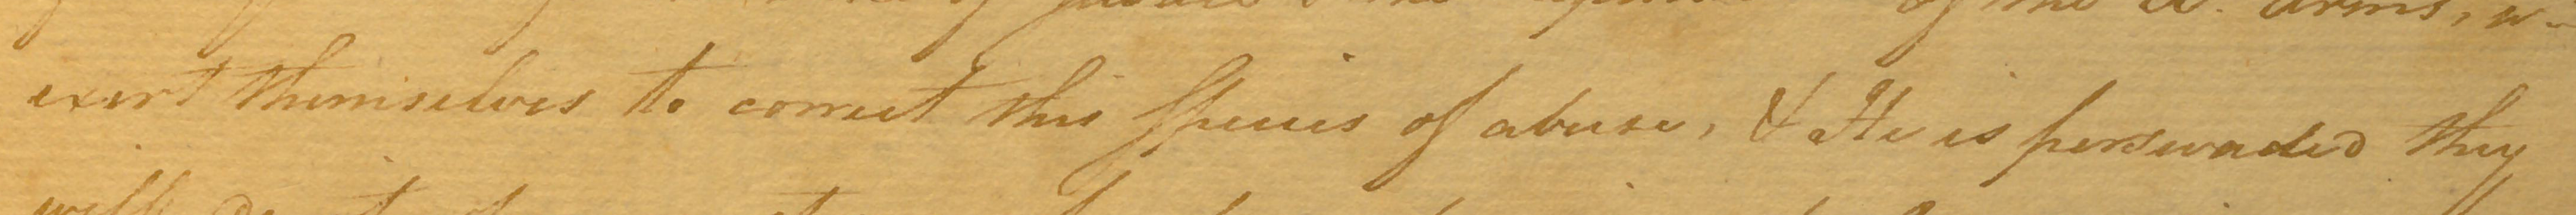exert themselves to correct the Species of abuse, & He is perswaded they
